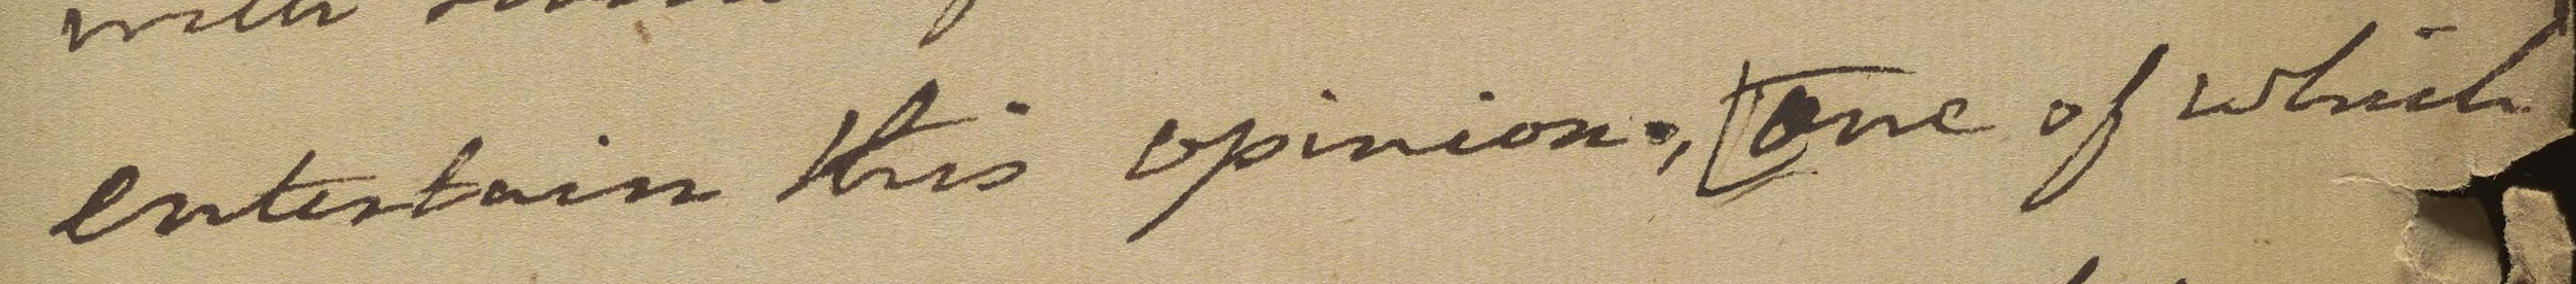entertain this opinion. (One of which
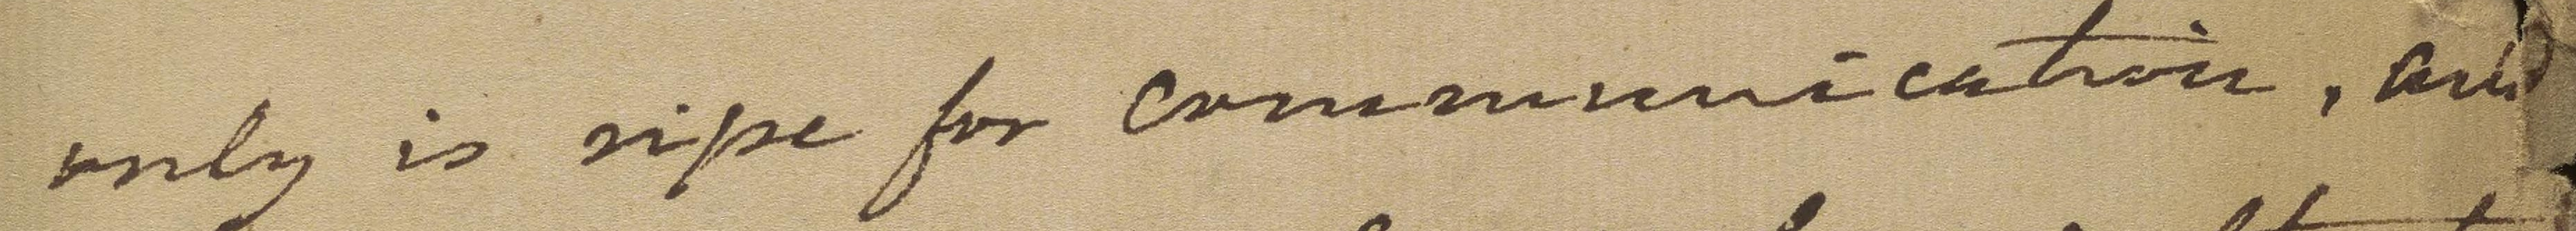only is ripe for communication, and
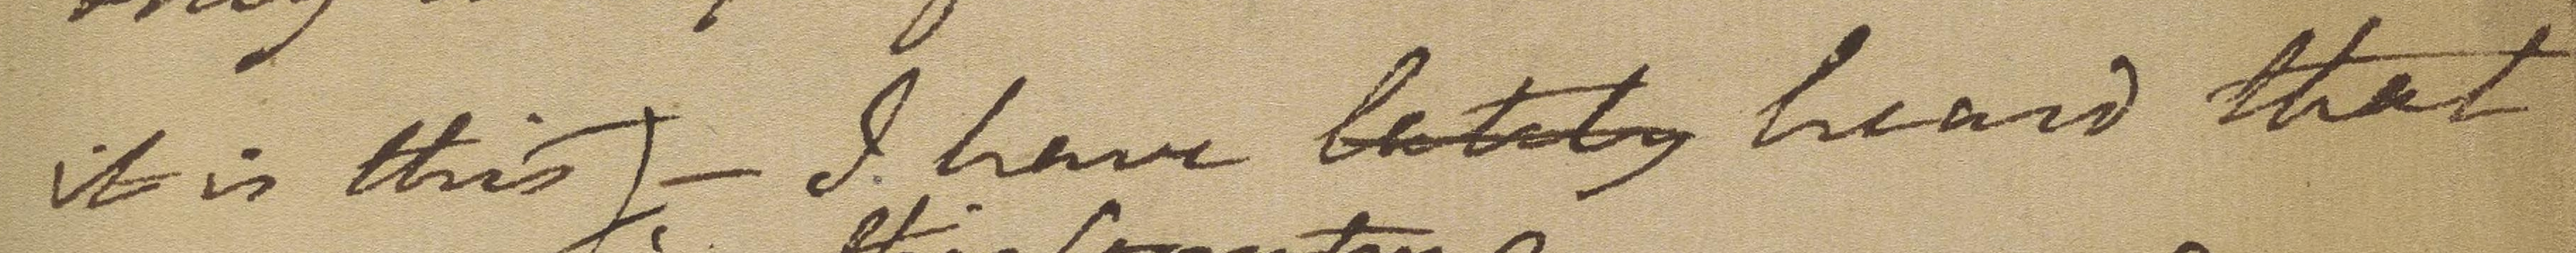it is this) I have [lately] heard that
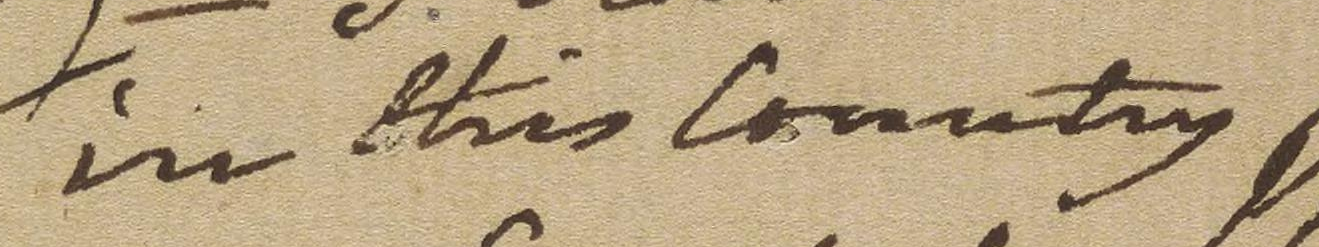in this country
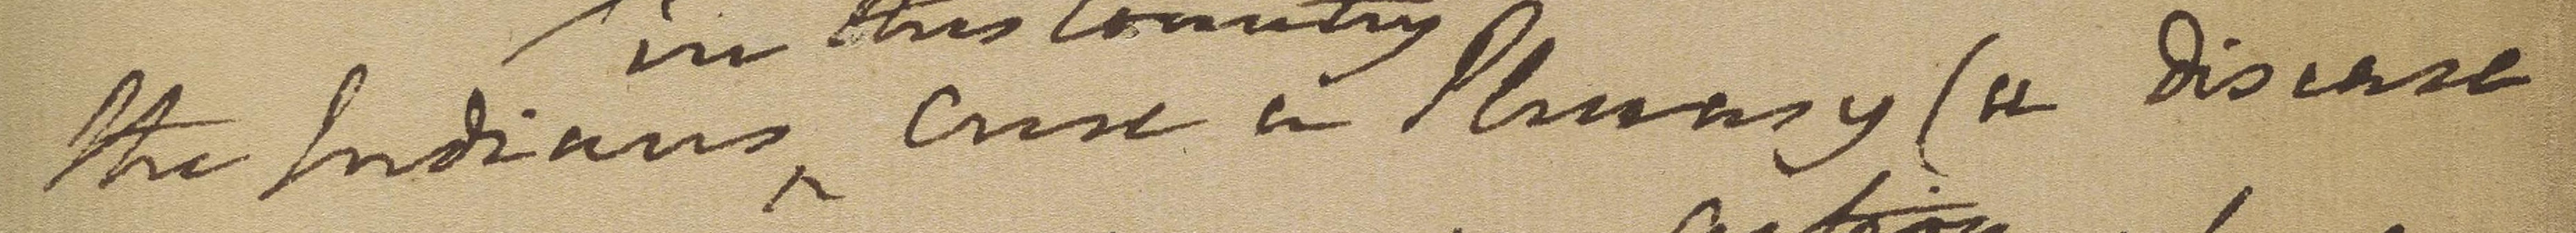the Indians ^ cure a Pleurasy (a disease
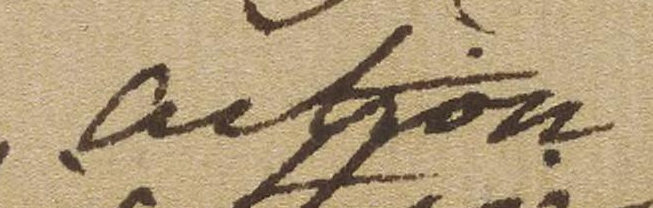action
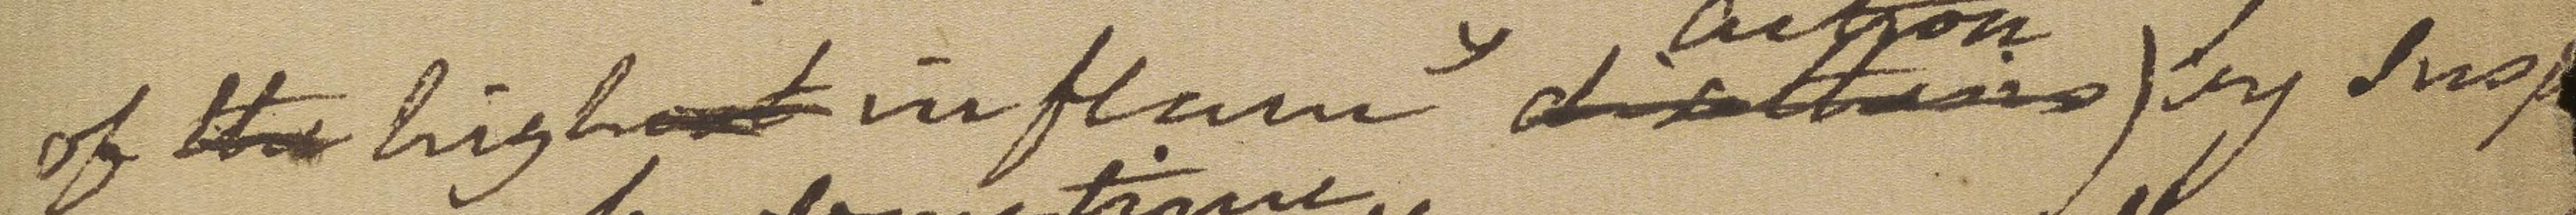of [the] high[est] inflam^y [diathesis]) by susp
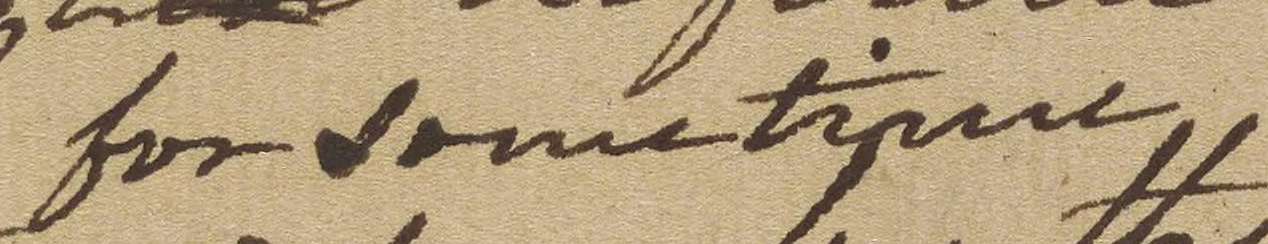for sometime
